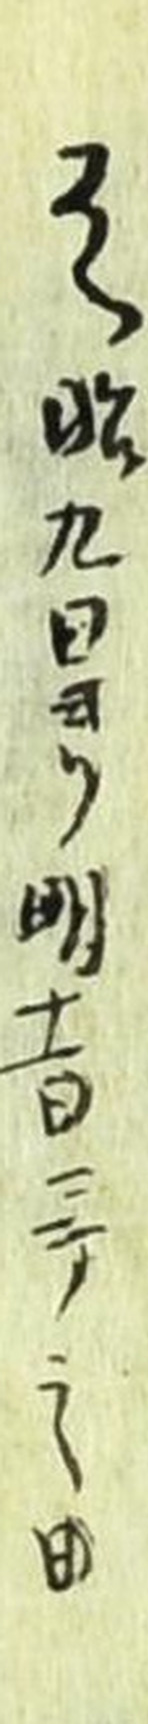去昨九日ヨリ明十一日マテ之由
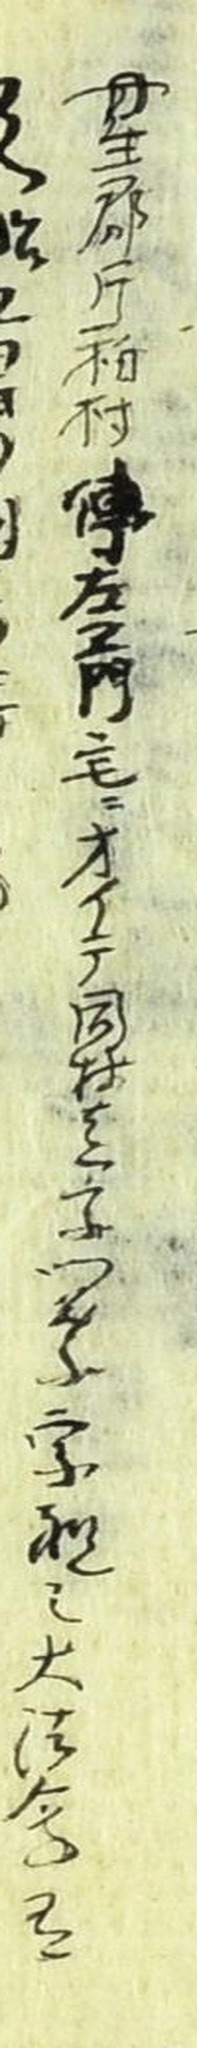丹生郡片粕村伝左ヱ門宅ニオイテ同村真宗門葉宗祖之大法会有
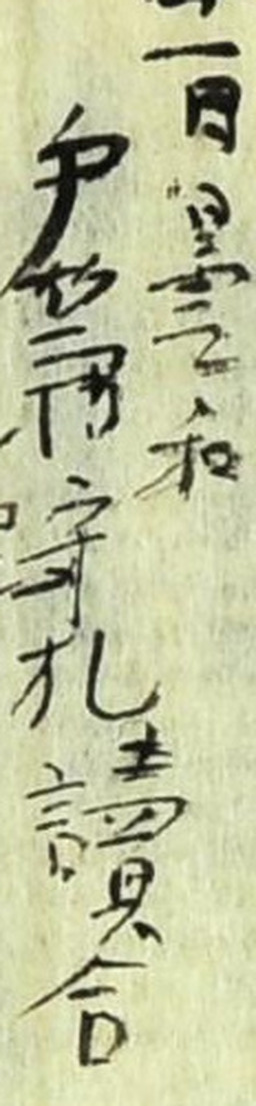戸籍守札読合
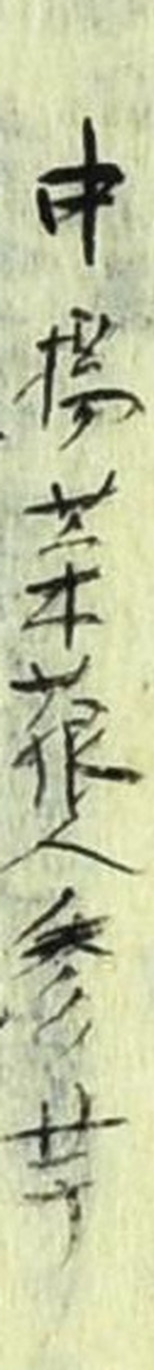中揚菜菔人参芋
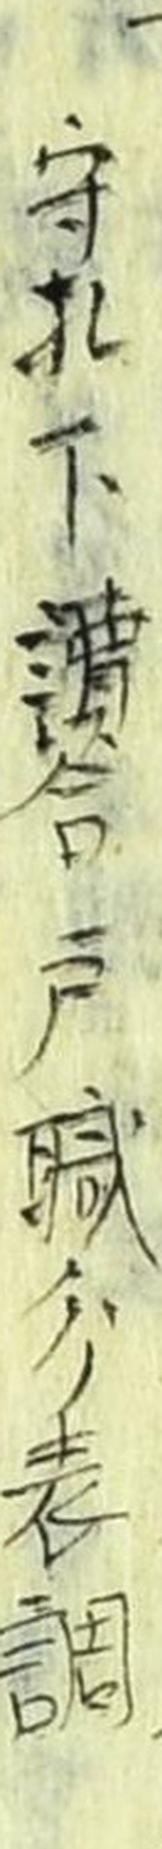守札下読合戸職分表調
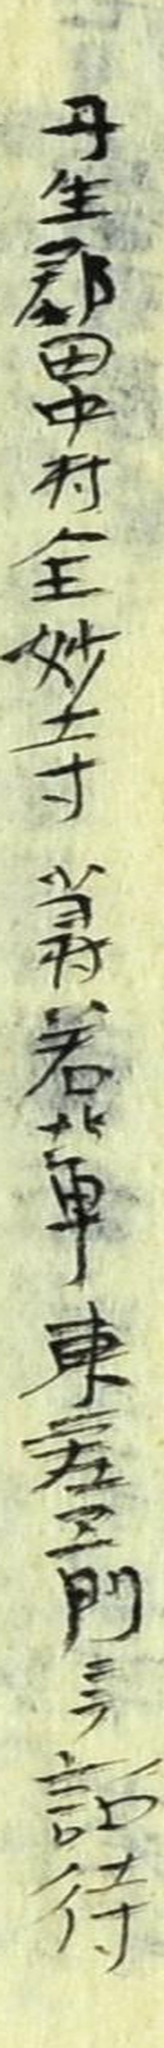丹生郡田中村全妙当村若輩東二左ヱ門ニテ詔待
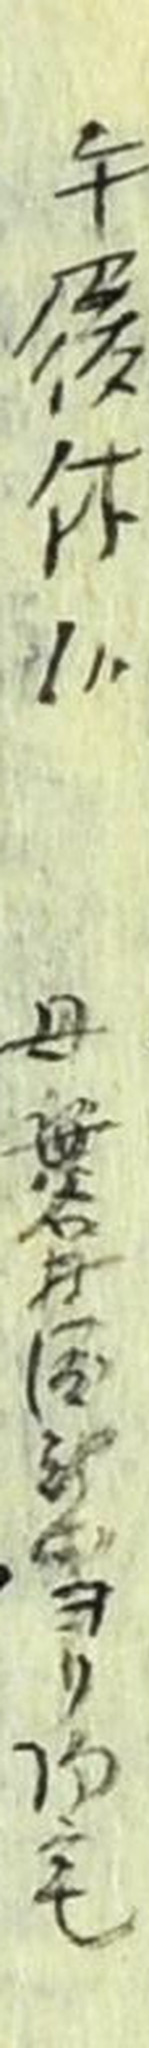午後休候母笹谷村渡部氏ヨリ帰宅
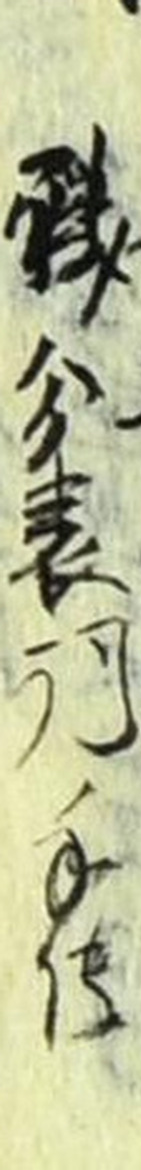職分表調手伝
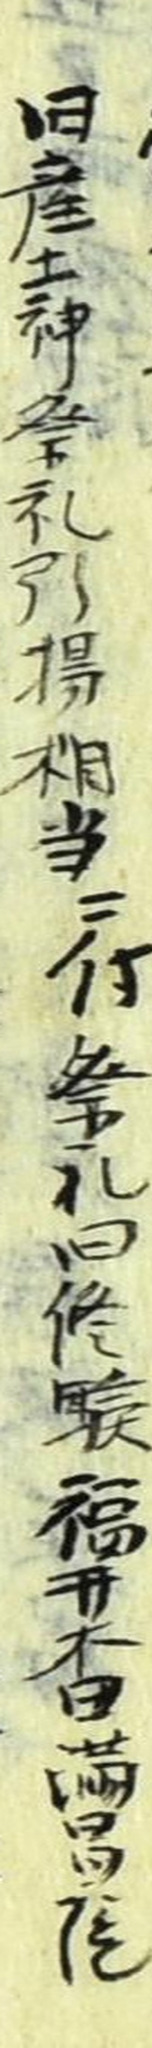旧産土神祭礼引揚相当ニ付祭礼旧修験福井木田満昌院
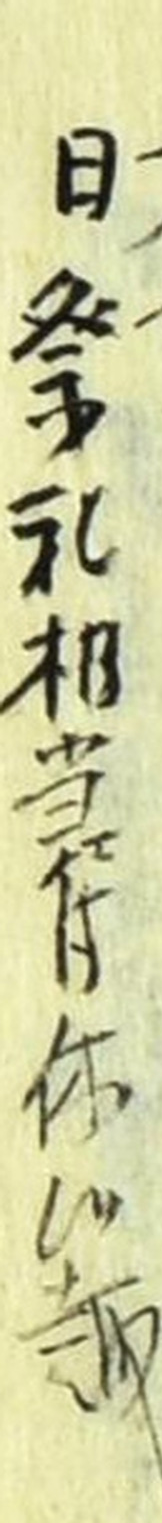日祭礼相当ニ付休候趣

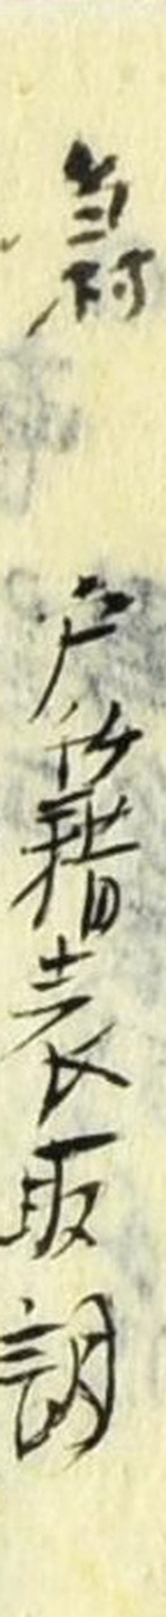戸籍表取調
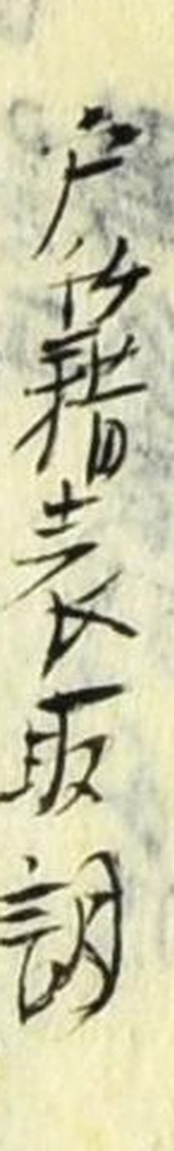戸籍表取調
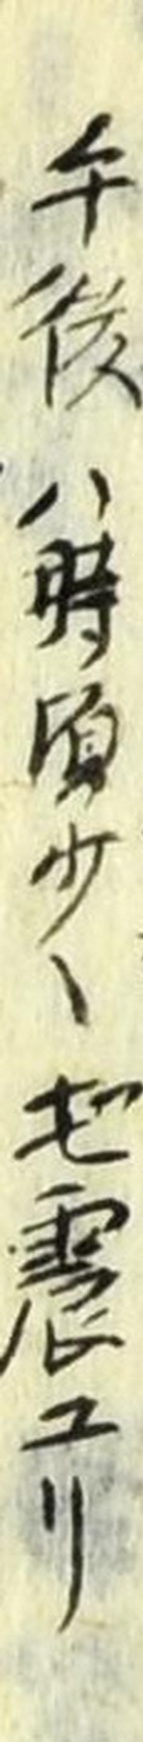午後八時頃少々地震ユリ
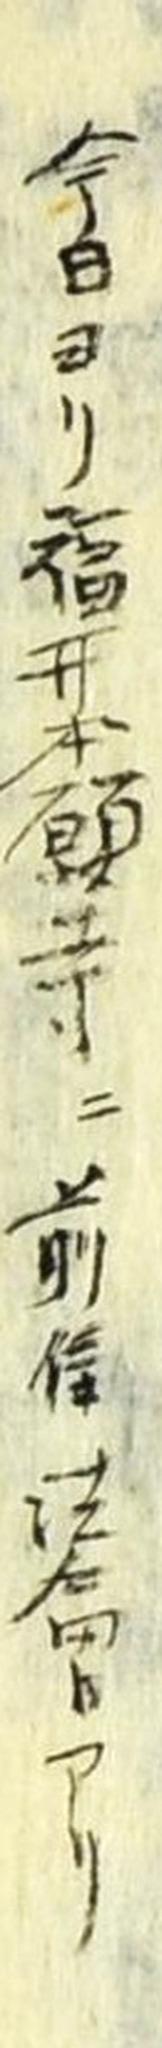今日ヨリ福井本願寺ニ前住法会アリ
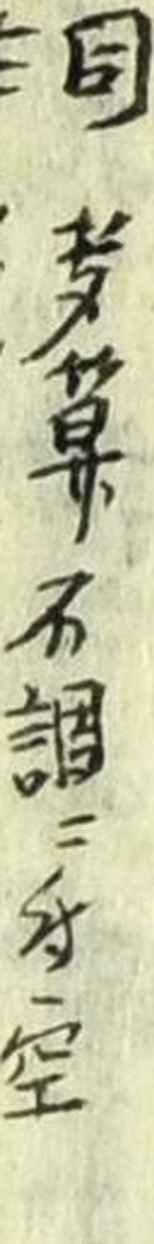同考算不調ニ付空
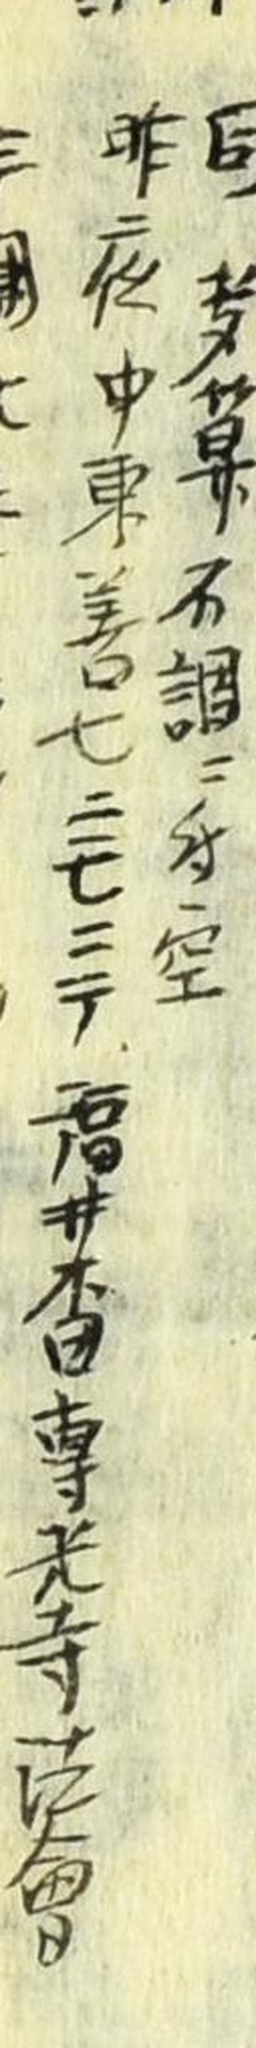昨夜中東善七ニ亡ニテ福井木田専光寺法会
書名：（日記）
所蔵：福井県文書館 Fukui Prefectural Archives
